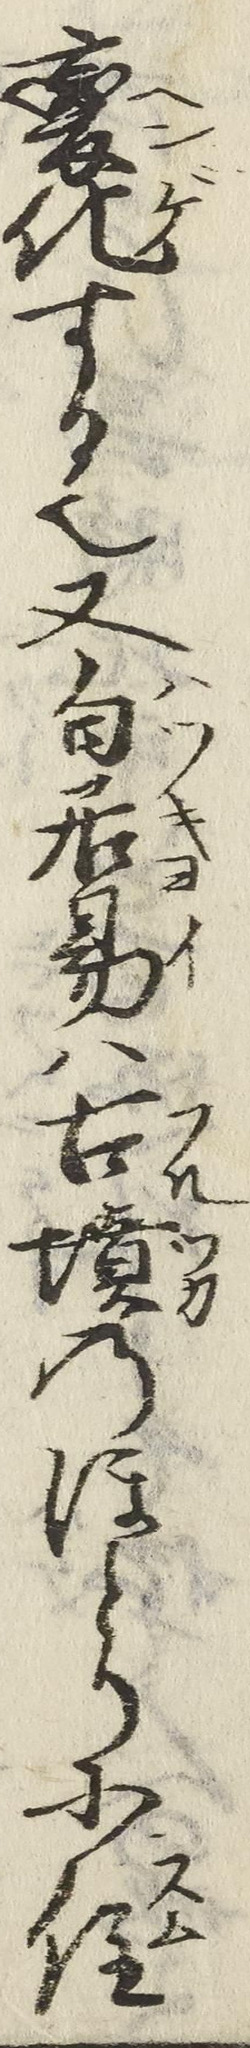変化する也又白居易は古墳のほとりに住
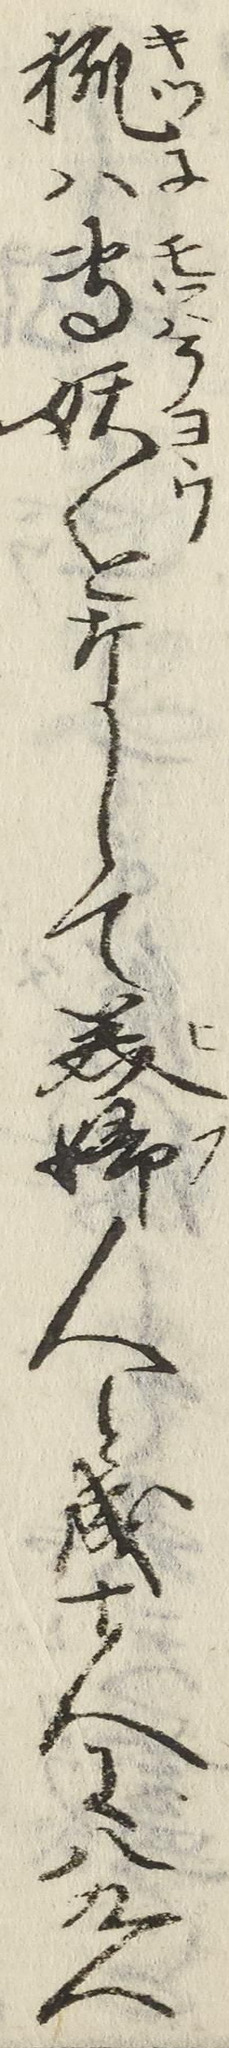狐は専妖をなして美婦人と成十人に八九人
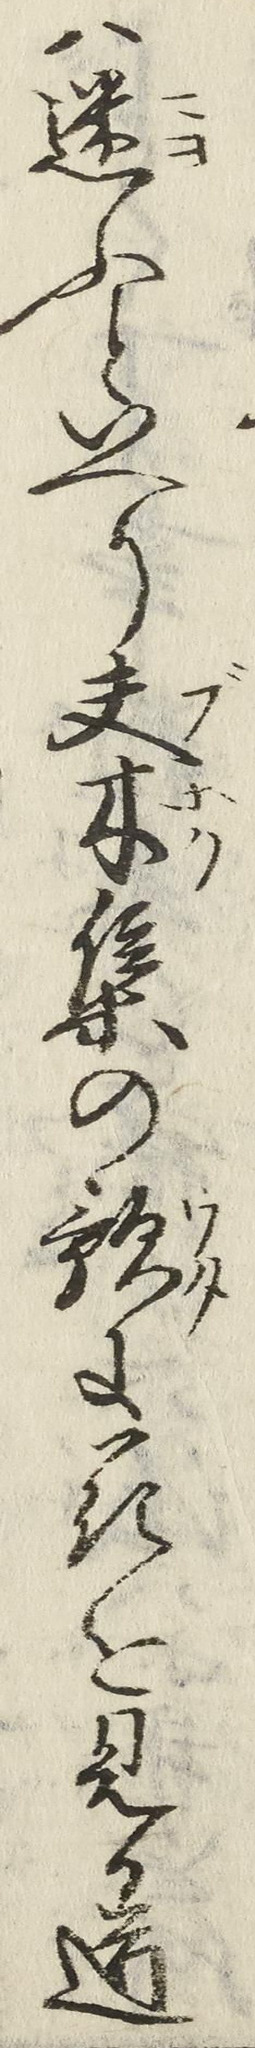は迷ふといへり夫木集の歌に花を見る道
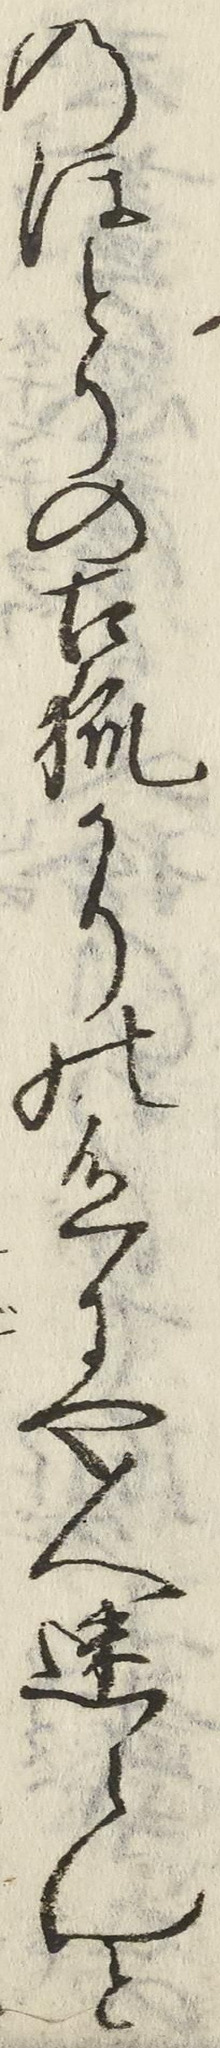のほとりの古狐かりの色にや人迷わんと
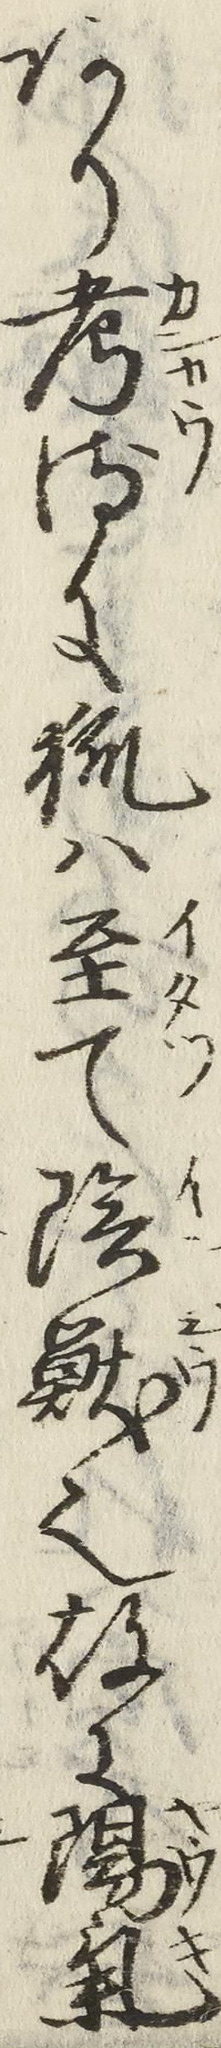あり考るに狐は至て陰獣也故に陽気
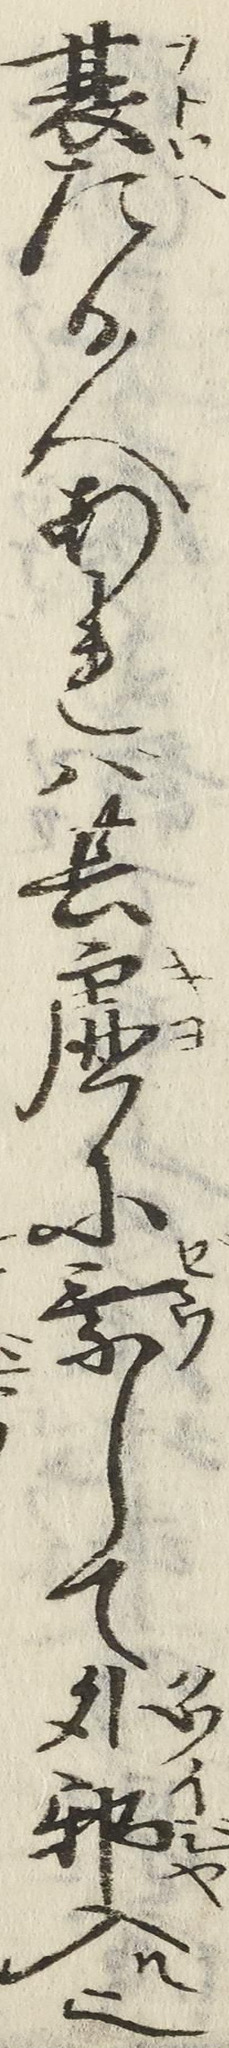衰たる人あれは其虚に乗して外邪入ル也
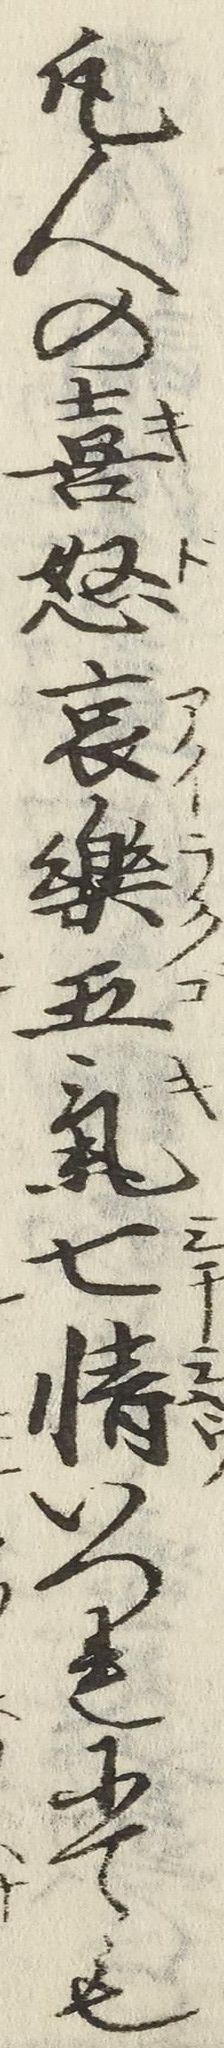凢人の喜怒哀楽五気七情いつれにても
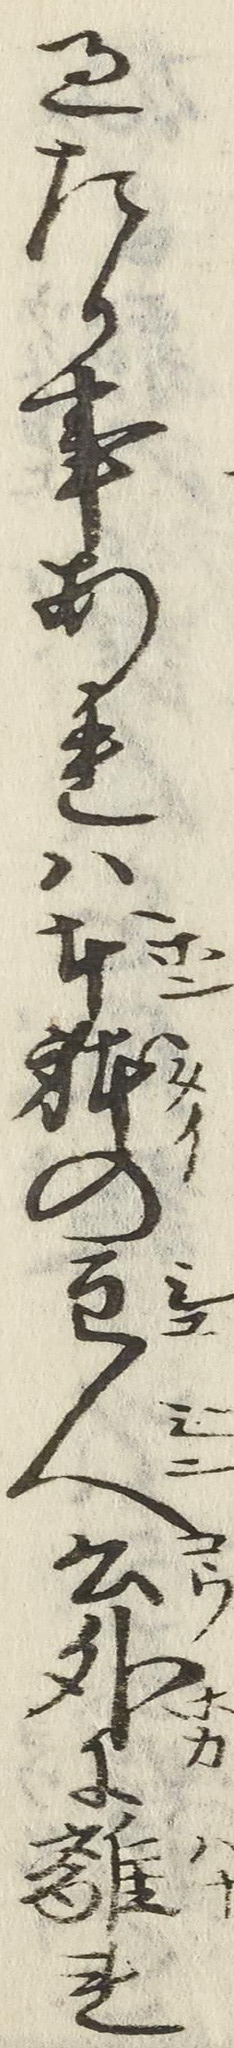過たる事あれは本躰の主人公外に離れ
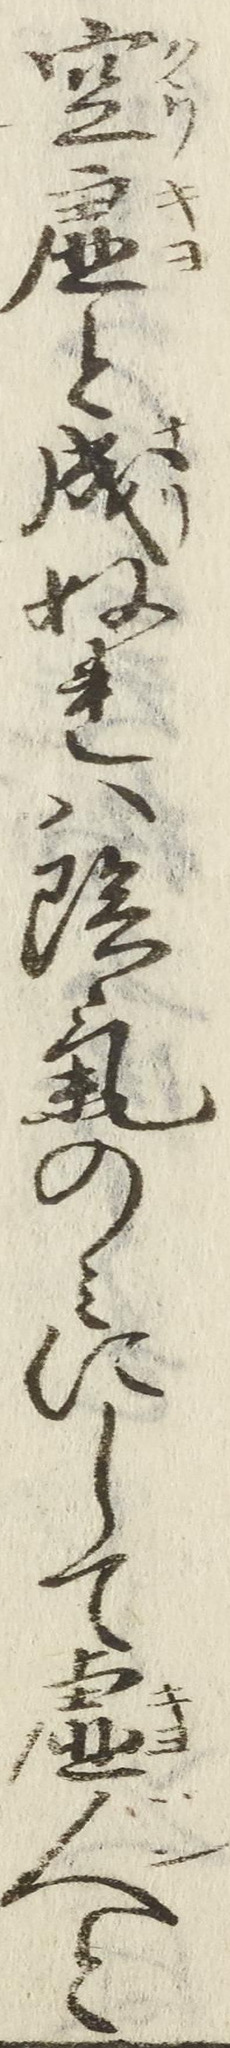空虚と成ぬれは陰気のみにして虚人と
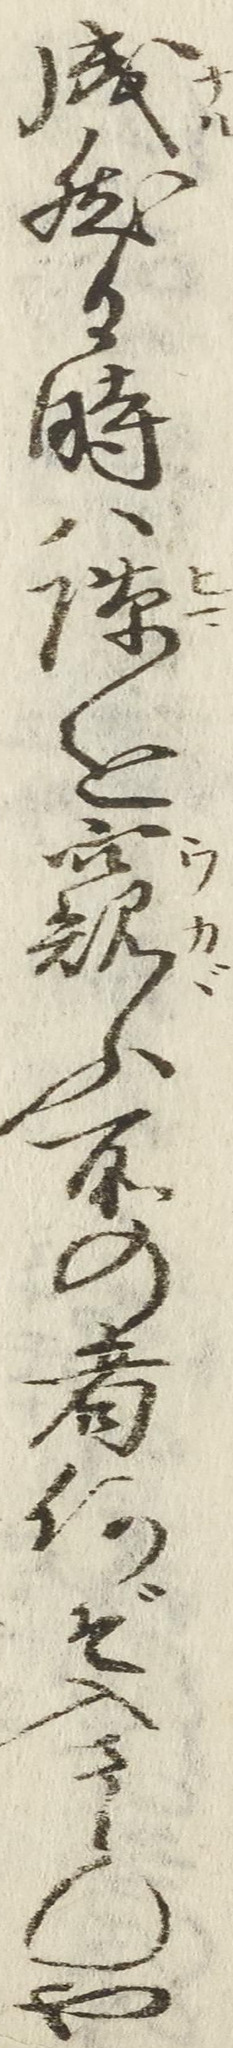成然る時は隙と窺ふ所の者何ぞ入さしんや
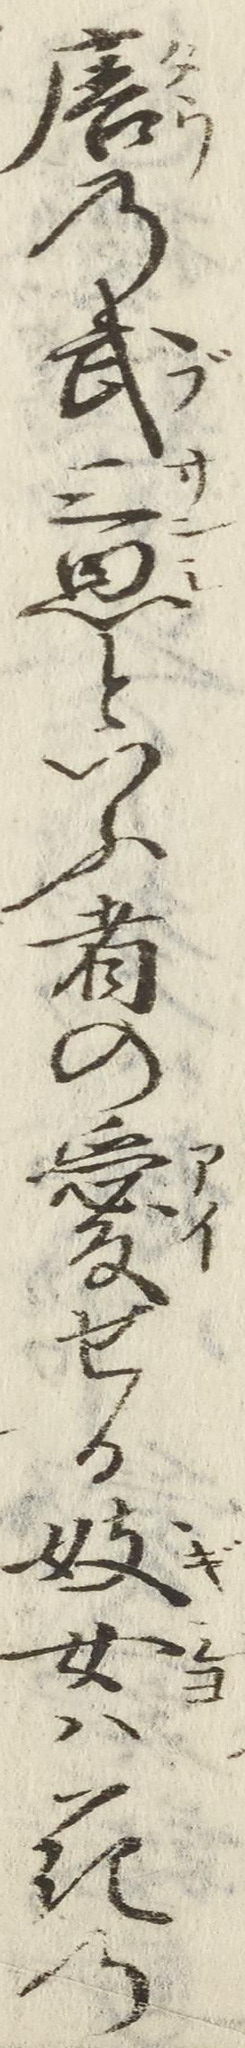唐の武三思といふ者の愛せる妓女は花の
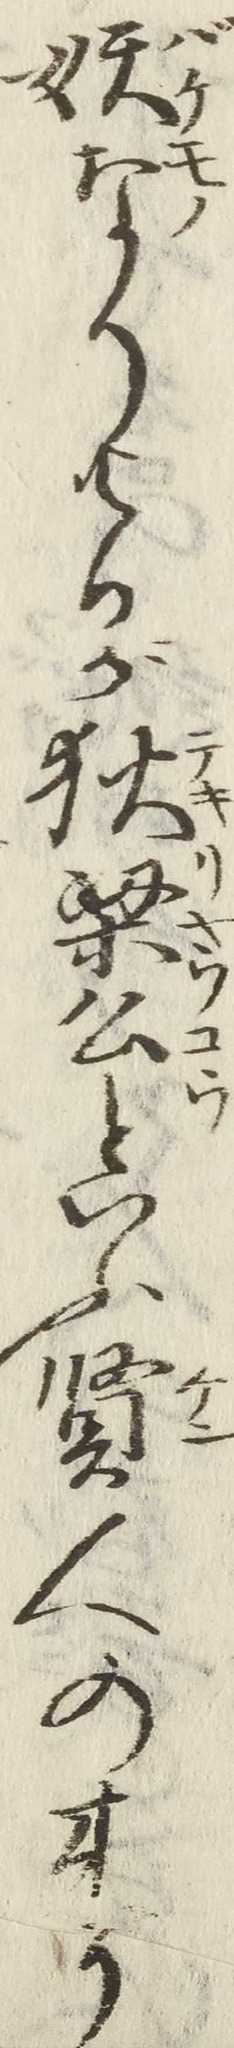妖なりけるが狄梁公といふ賢人の来り
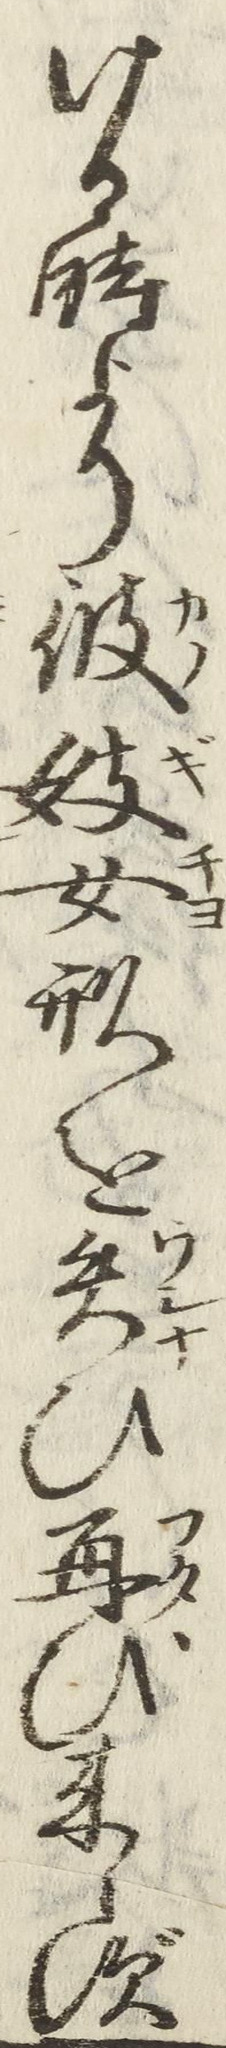ける時より彼妓女形を失ひ再ひ来らず
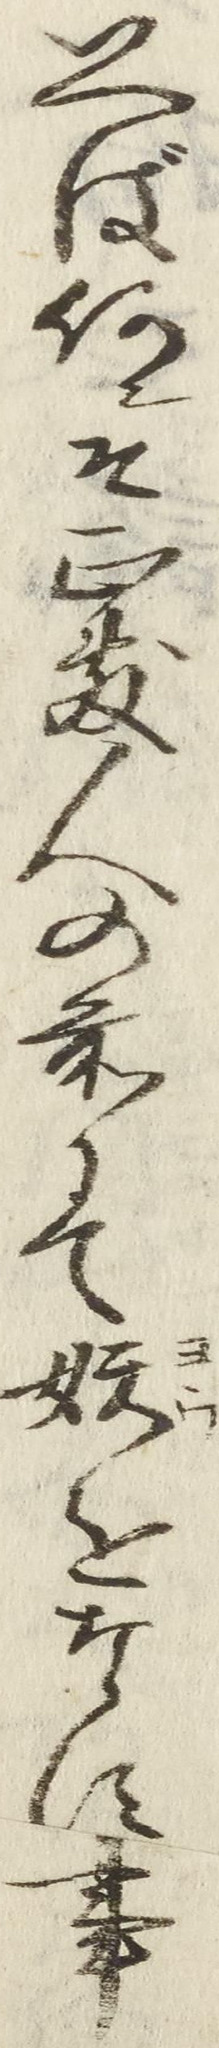いへば何んそ正敷人の前にて妖をなす事
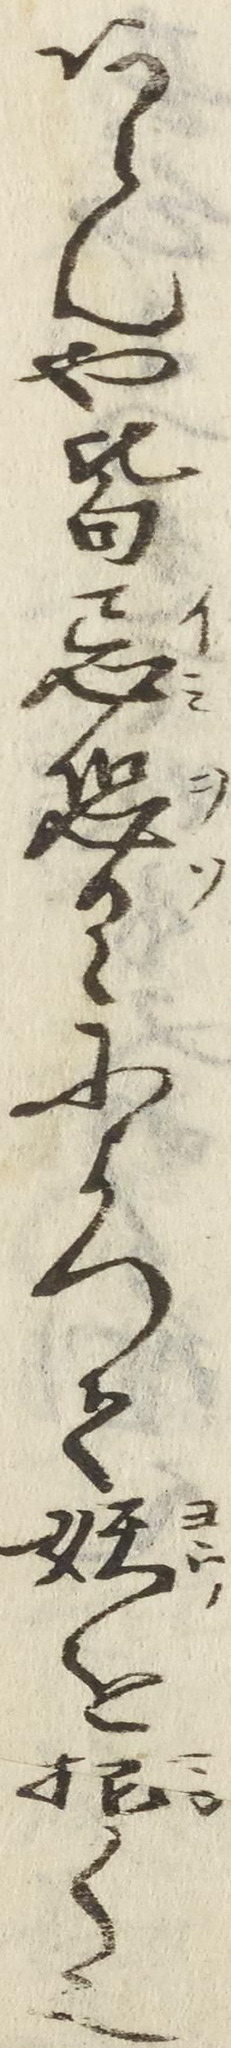あらんや皆忌恐るゝによつて妖を招く也

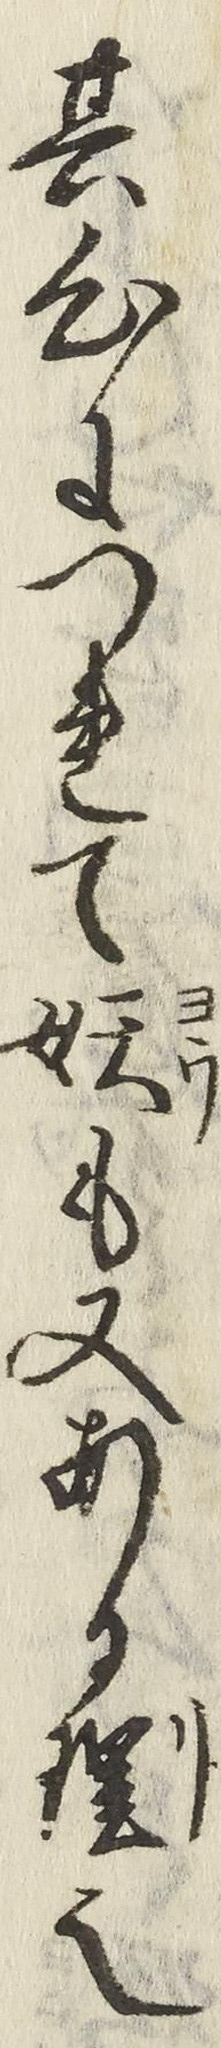其心につれて妖も又ある理也
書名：天地或問珍　地
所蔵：東京大学地震研究所図書室 Earthquake Research Institute Library, The University of Tokyo, JAPAN
